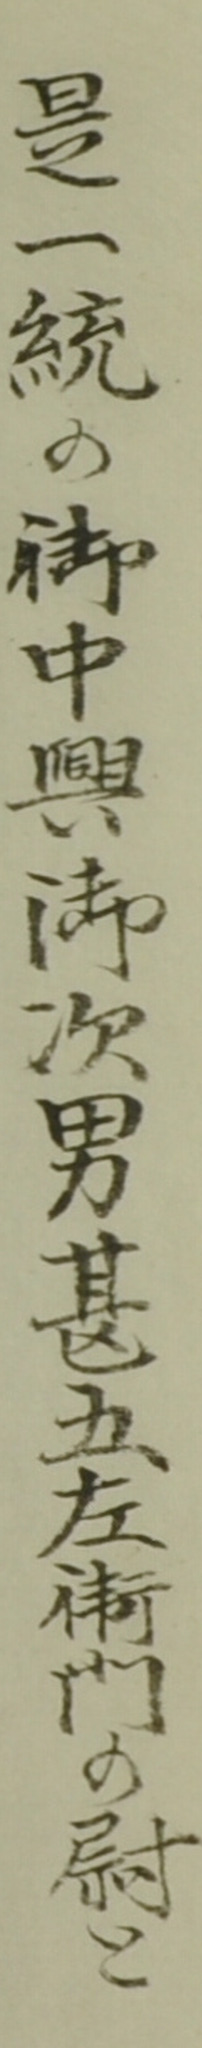是一統の御中興御次男甚五左衛門の尉と
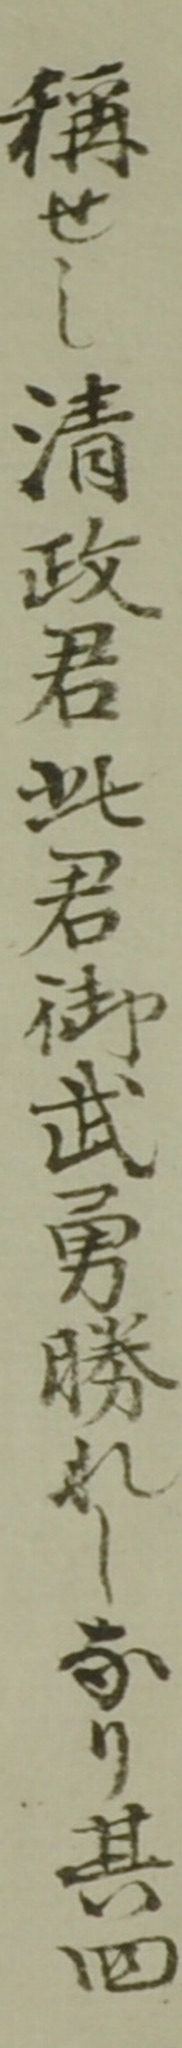称せし清政君此君御武勇勝れしなり其四
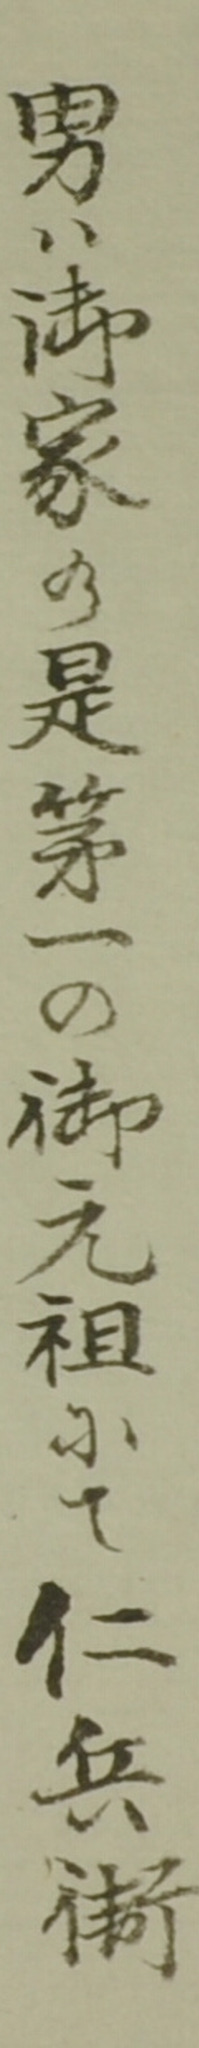男は御家の是第一の御元祖にて仁兵衛
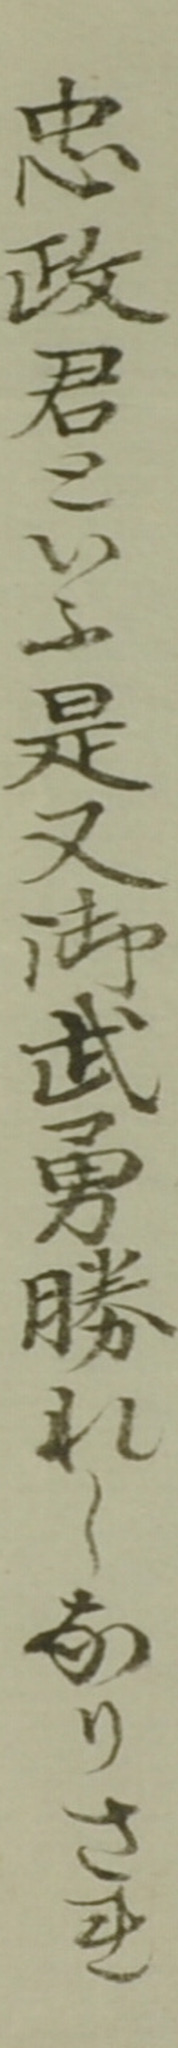忠政君といふ是又御武勇勝れしなりされ
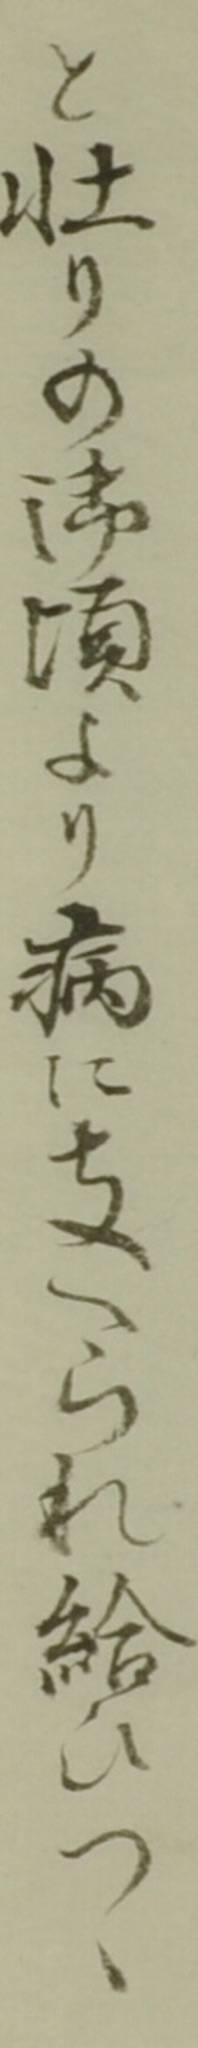と壮りの御頃より病に支へられ給ひつゝ
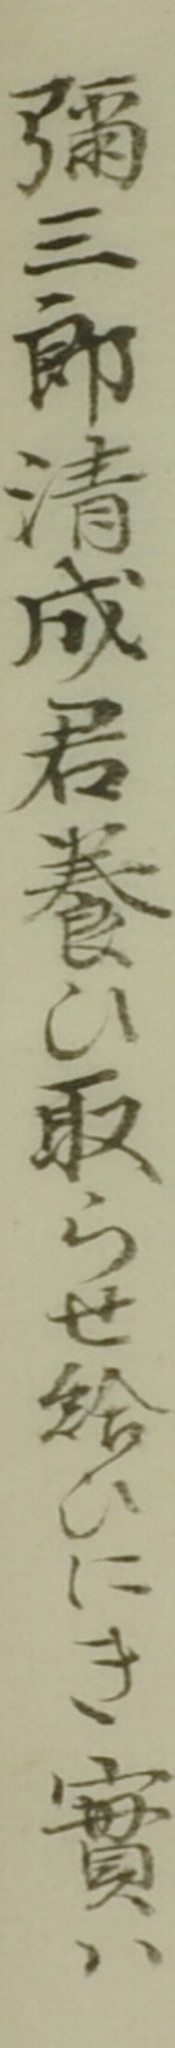彌三郎清成君養ひ取らせ給ひにき実は
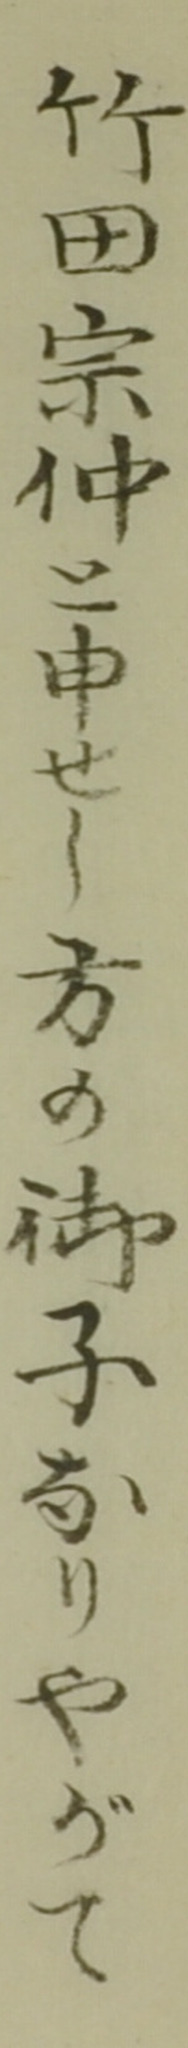竹田宗仲と申せし方の御子なりやがて
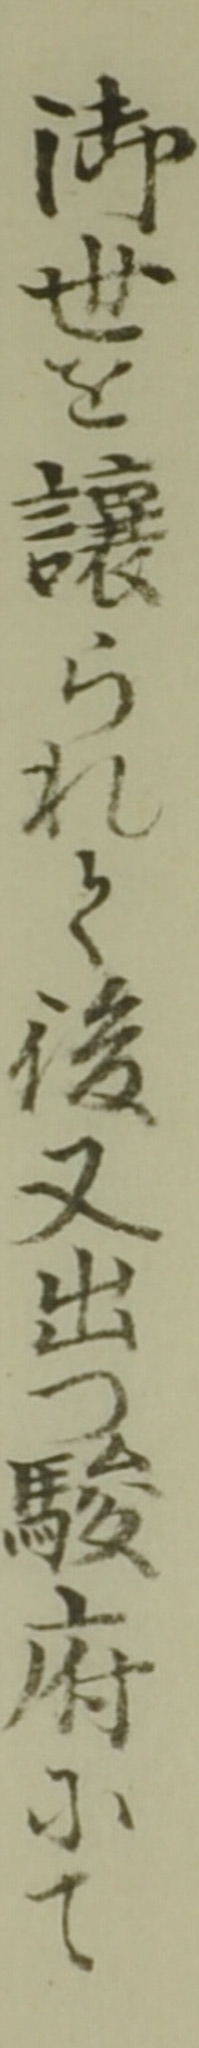御世を譲られて後又出つ駿府にて
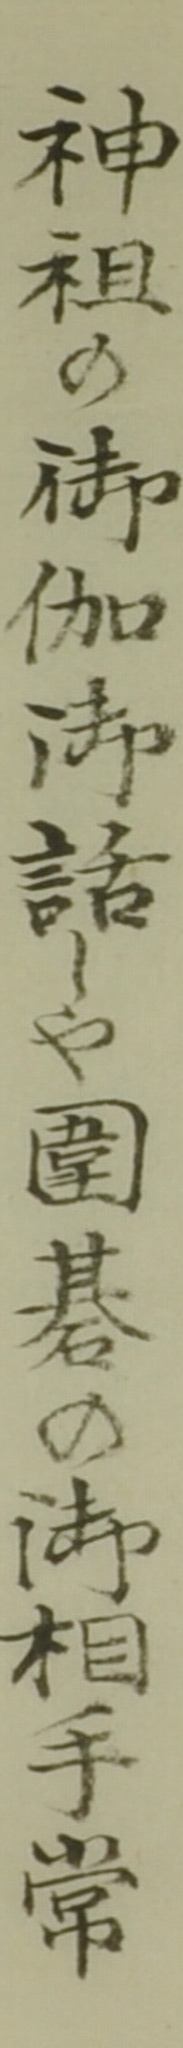神祖の御伽御話しや圍碁の御相手常
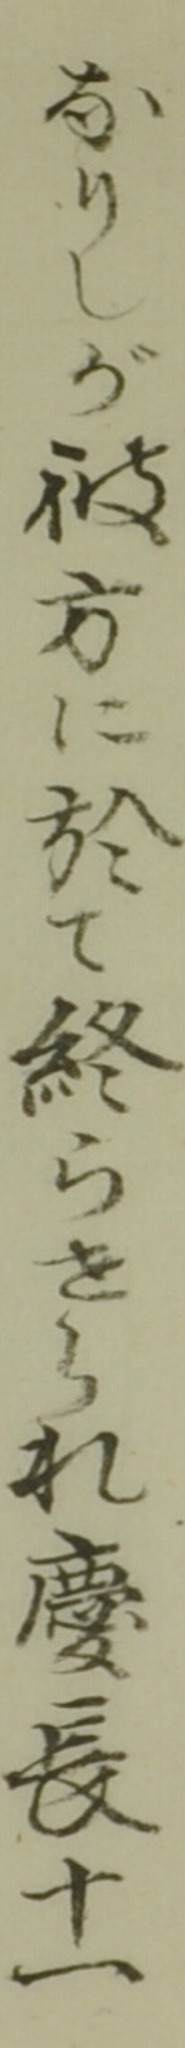なりしが彼方に於て終らせられ慶長十一
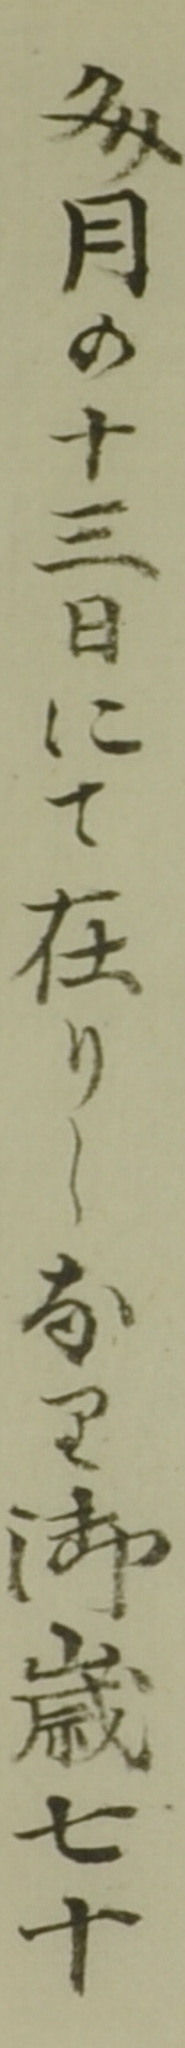文月の十三日にて在りしなり御歳七十
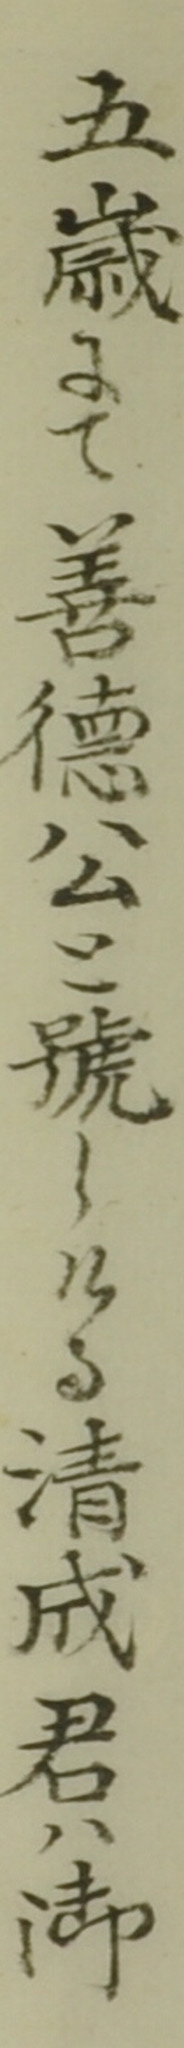五歳にて善徳公と号しける清成君は御

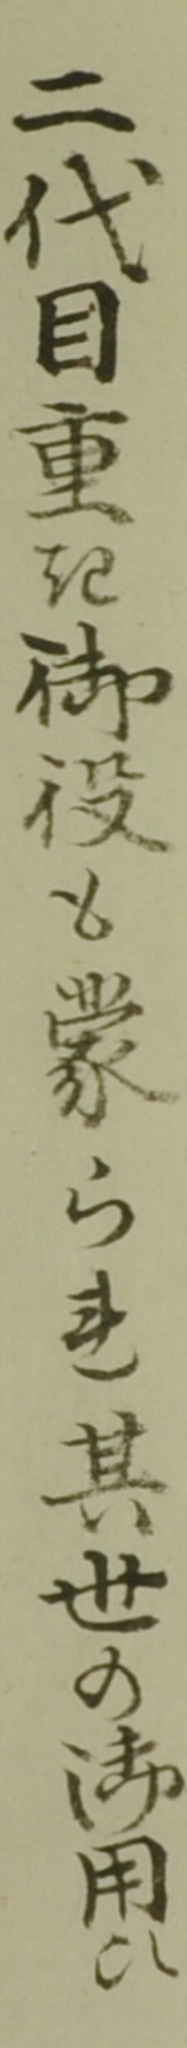二代目重き御役も蒙られ其世の御用ひ
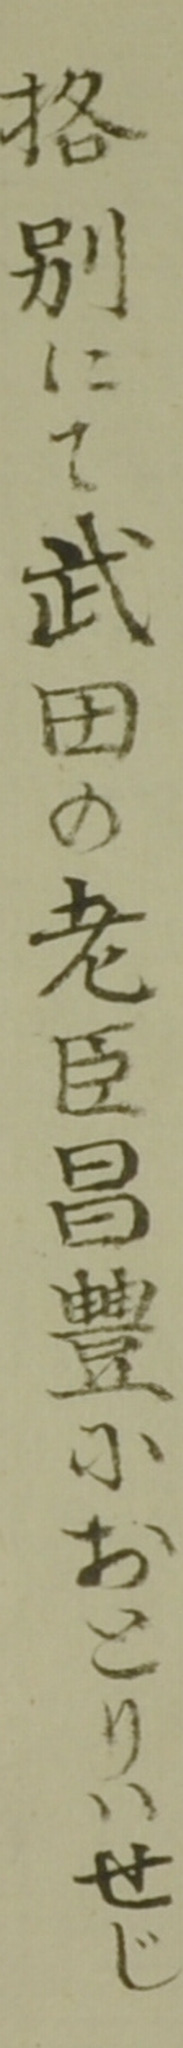格別にて武田の老臣昌豊におとりはせじ
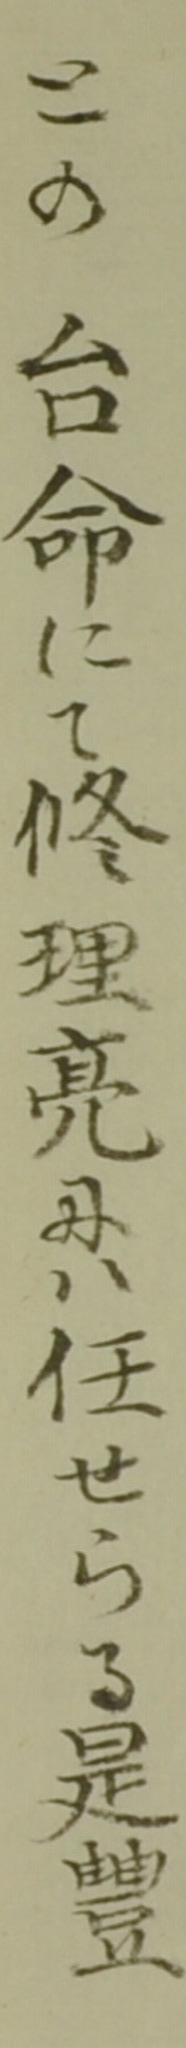との台命にて修理亮には任せらる是豊
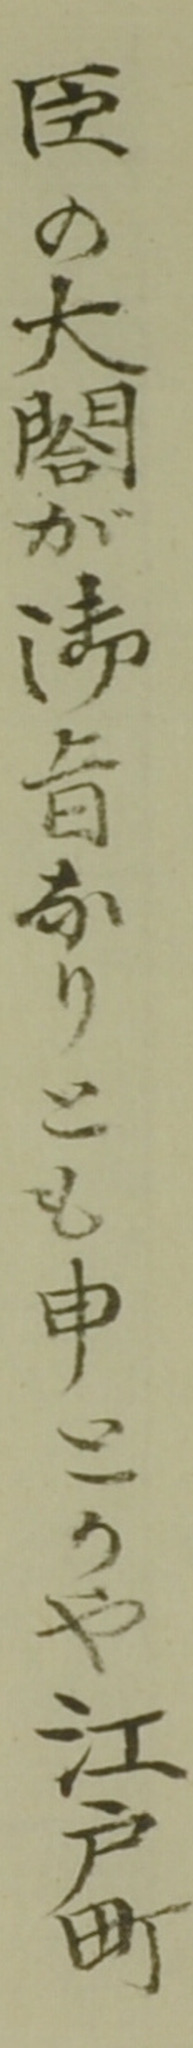臣の大閤が御旨なりとも申とかや江戸町
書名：藤葛（全）
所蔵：伊那市立高遠町図書館・合同会社AMANE
